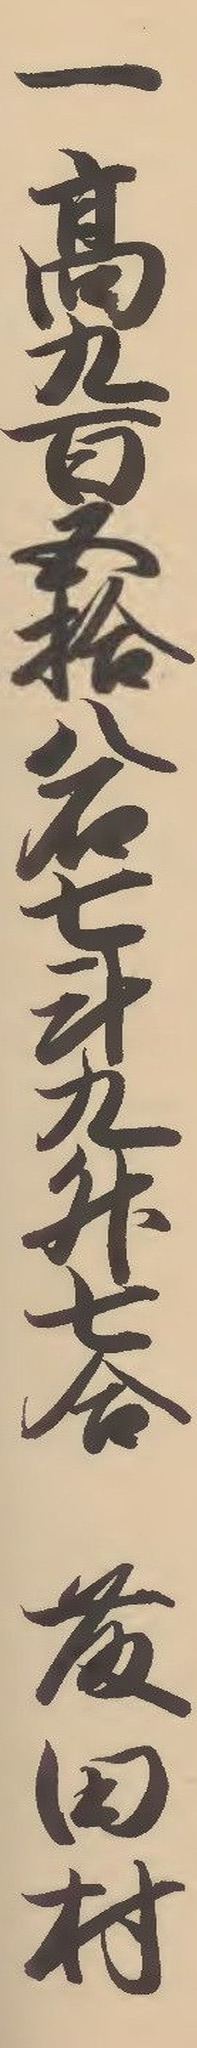一高九百五拾八石七斗九升七合藤田村
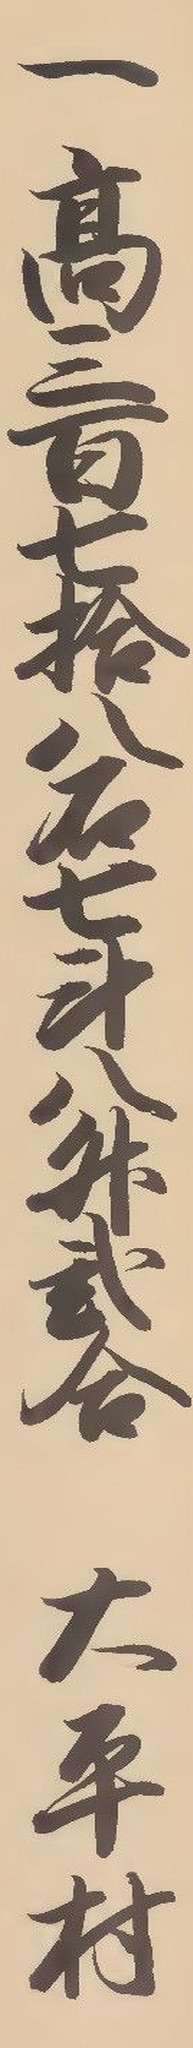一高三百七拾八石七斗八升弐合大平村
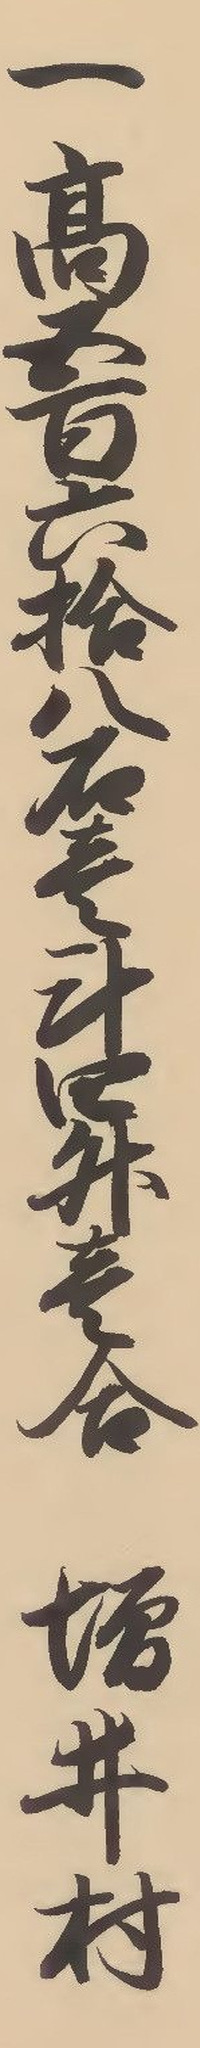一高五百六拾八石壱斗四升壱合増井村
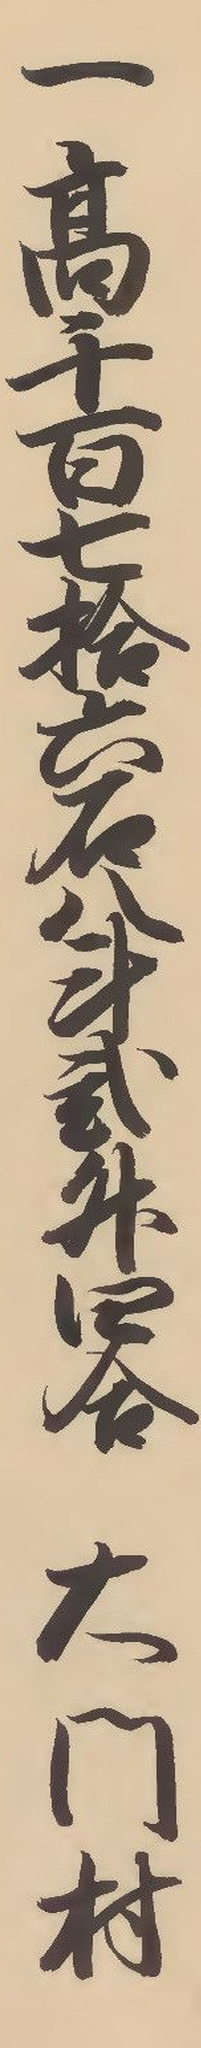一高千百七拾六石八斗弐升四合大門村
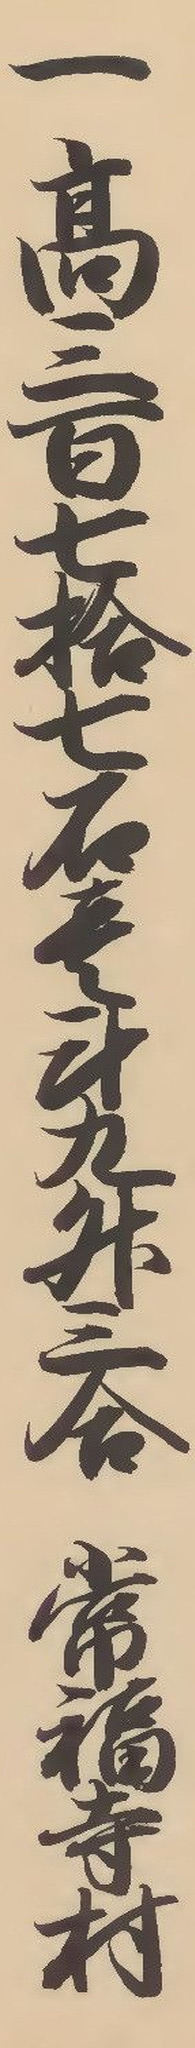一高三百七拾七石壱斗九升三合常福寺村

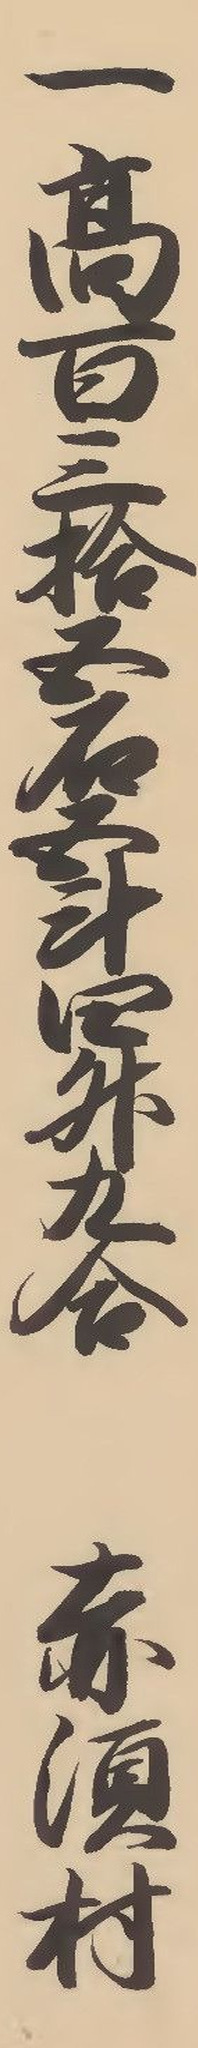一高百三拾五石五斗四升九合赤須村
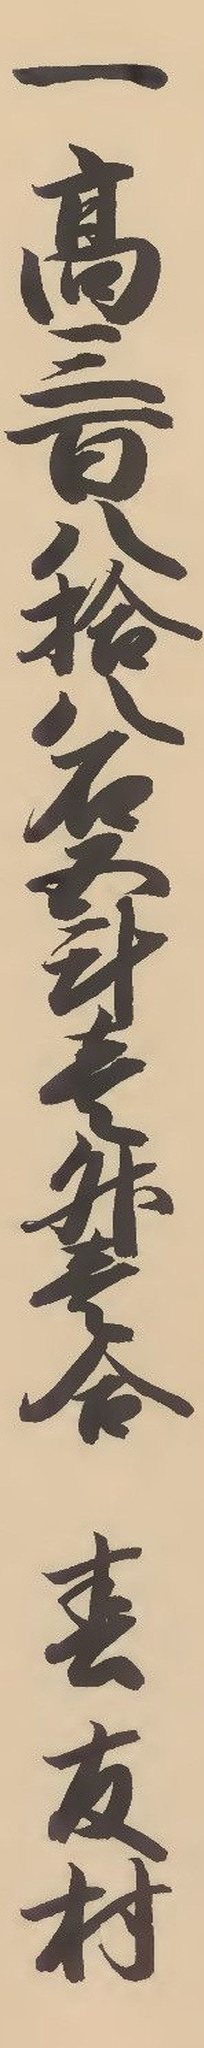一高三百八拾八石五斗壱升壱合春友村
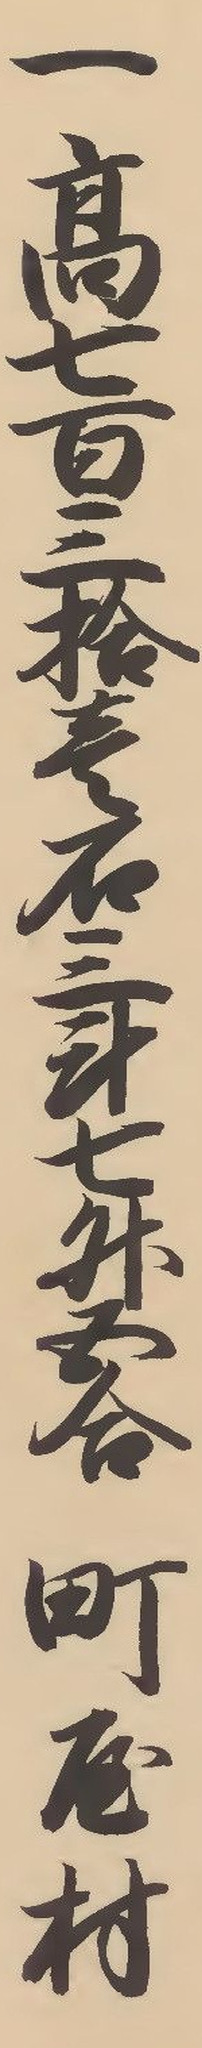一高七百三拾壱石三斗七升五合町屋村
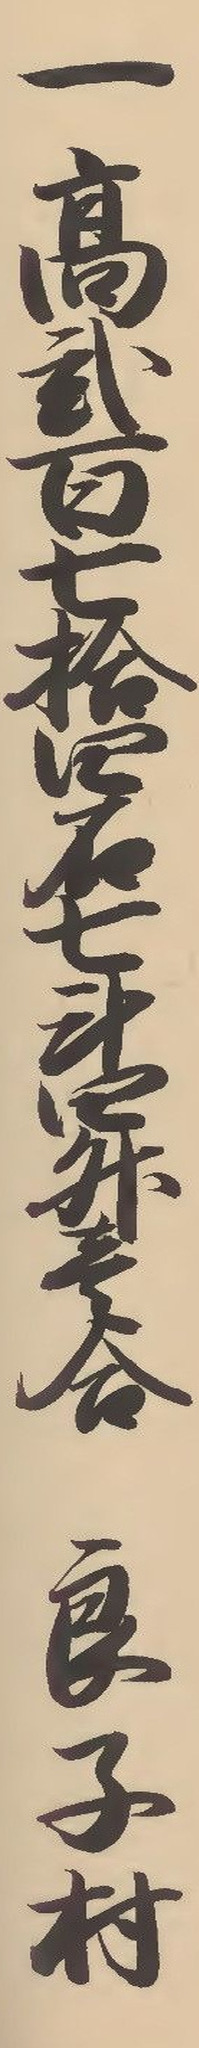一高弐百七拾四石七斗四升壱合良子村
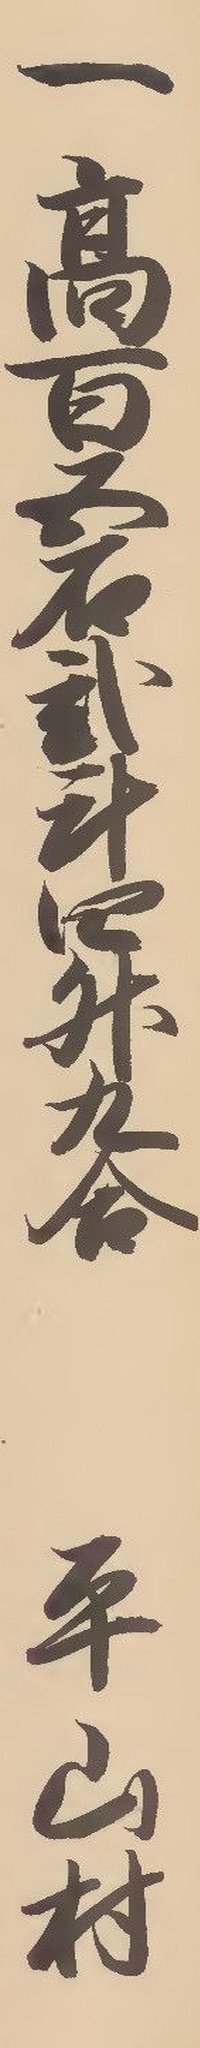一高百五石弐斗四升九合平山村
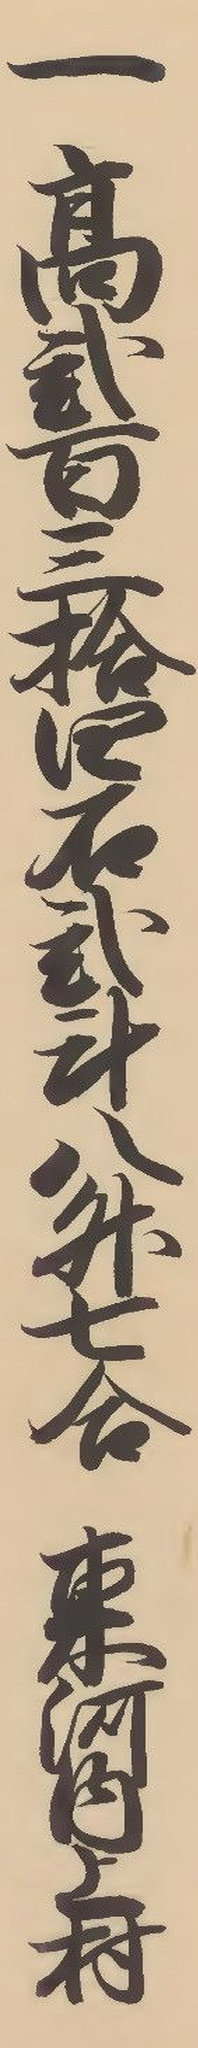一高弐百三拾四石弐斗八升七合東河内上村
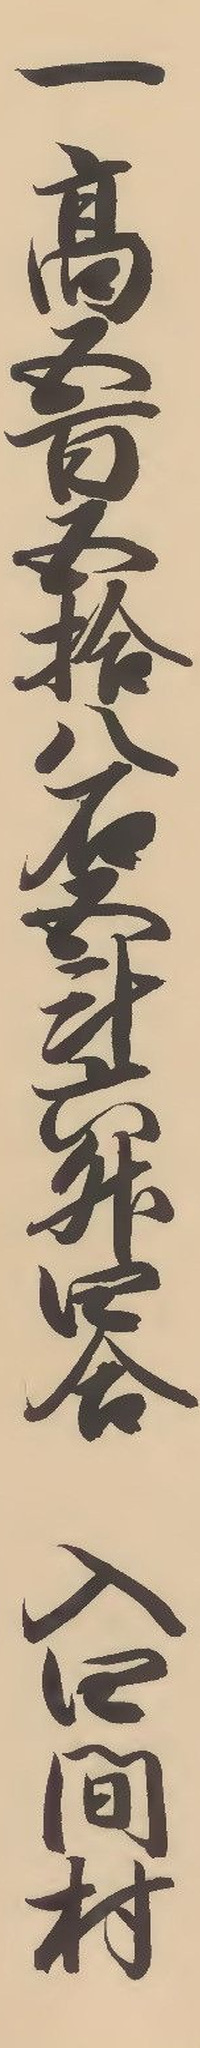一高五百五拾八石斗六升四合入四間村
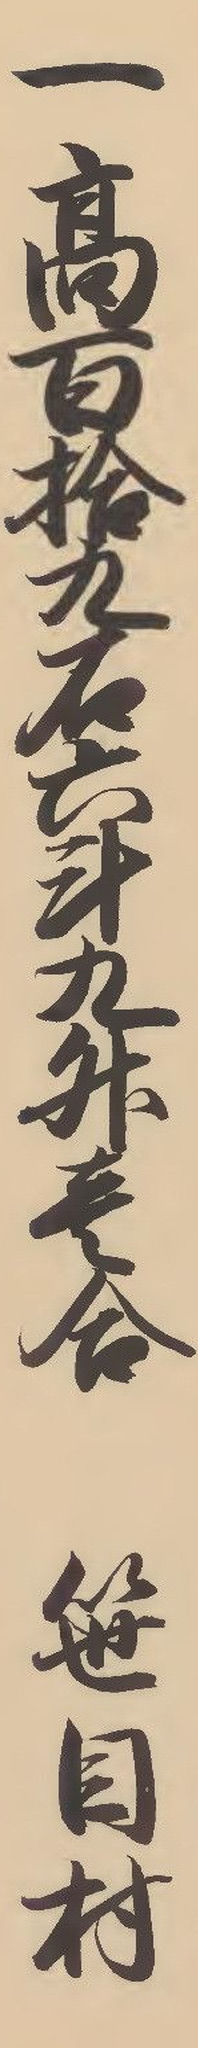一高百拾九石六斗九升壱合笹目村

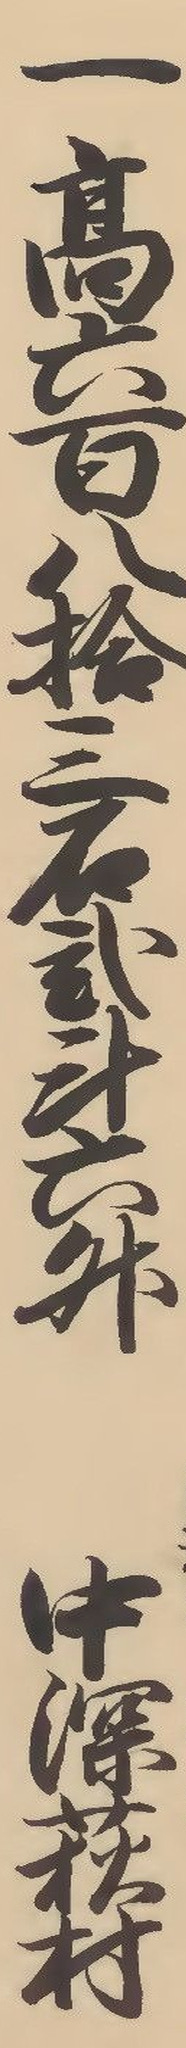一高六百八拾三石弐斗六升中深荻村
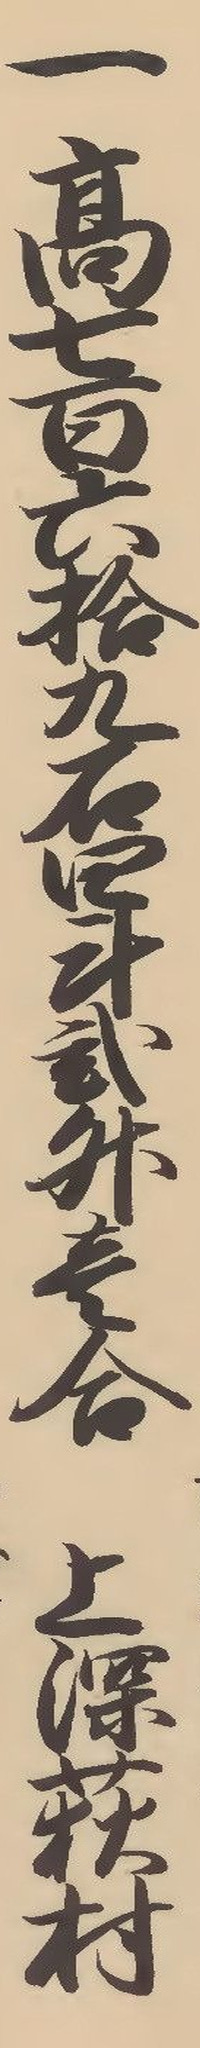一高七百六拾九石四斗弐升壱合上深荻村
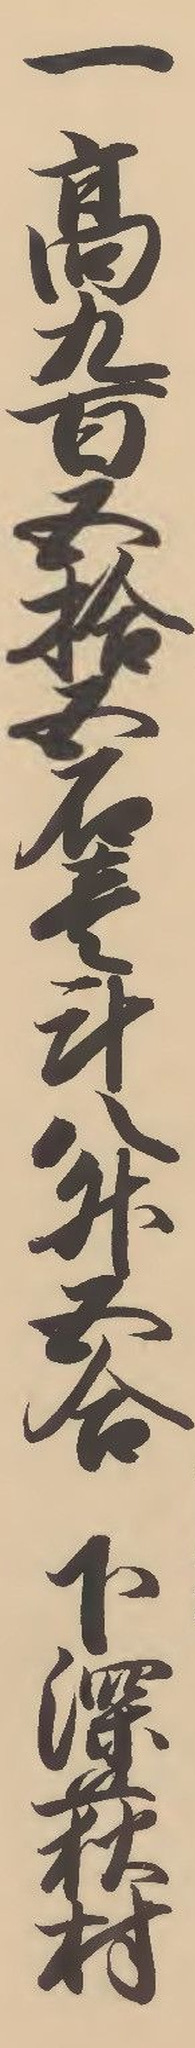一高九百五拾五石壱斗八升五合下深荻村
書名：常陸国郷帳
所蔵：国立公文書館 National Archives of Japan
